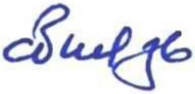свиязь
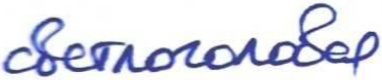светлоголовая
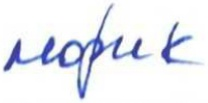люрик
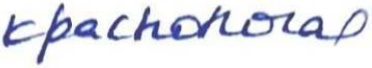красноногая
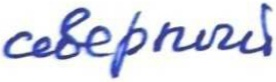северный
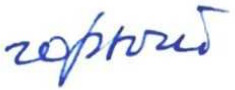горный
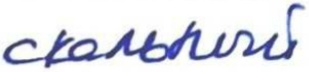скальный
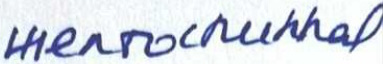желтоспинная
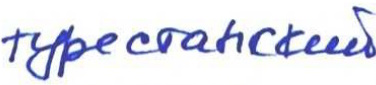турестанский
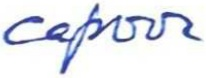сарыч
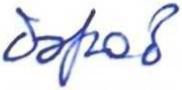бэров
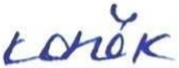конёк
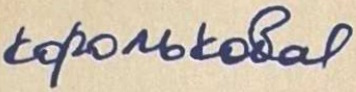корольковая
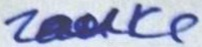галка
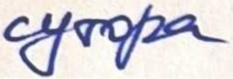сутора
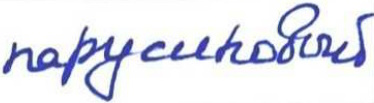парусиновый
